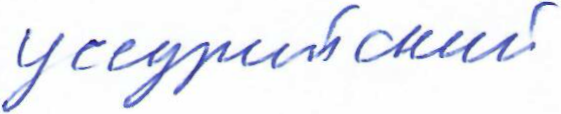уссурийский
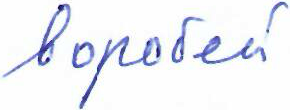воробей
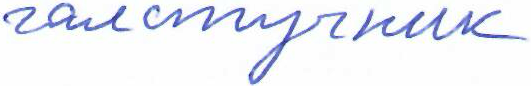галстучник
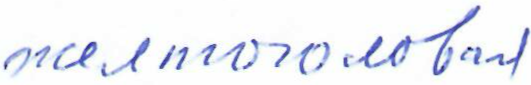желтоголовая
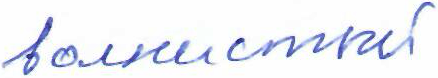волнистый
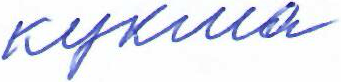кукша
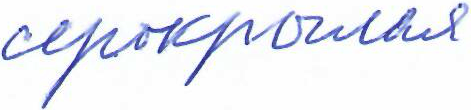серокрылая
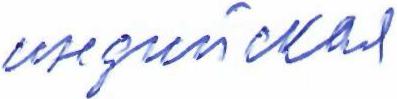индийская
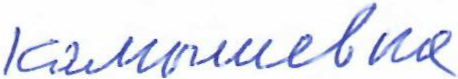камышевка
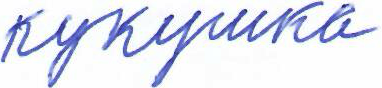кукушка
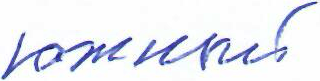южный
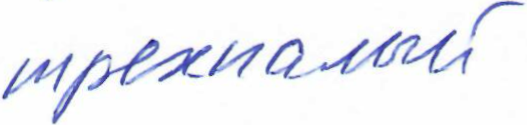трехпалый
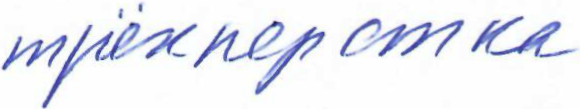трёхперстка
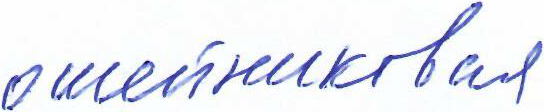ошейниковая
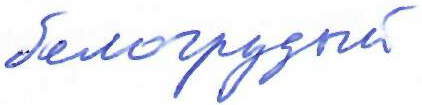белогрудый
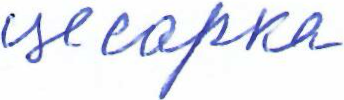цесарка
